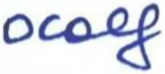осоед
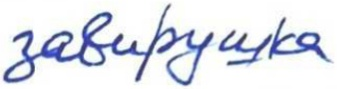завирушка
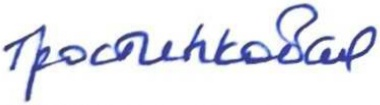тростинковая
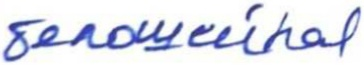белошейная
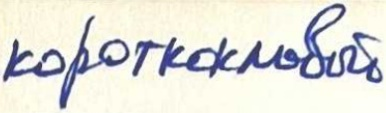короткоклювый
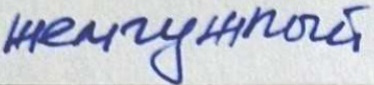жемчужный
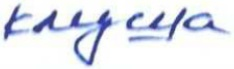клуша
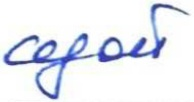седой
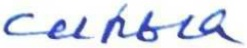синьга
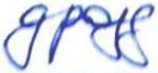дрозд
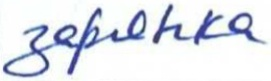зарянка
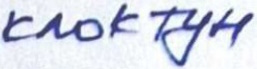клоктун
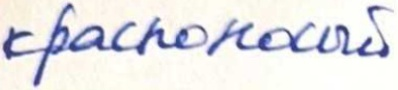красноносый
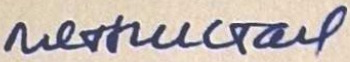пятнистая
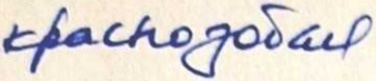краснозобая
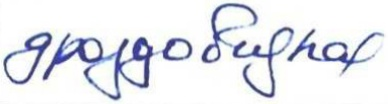дроздовидная
